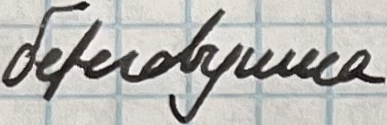береговушка
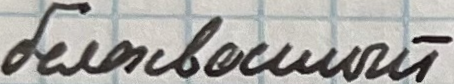белохвостый
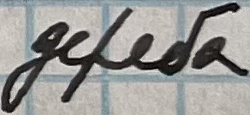деряба
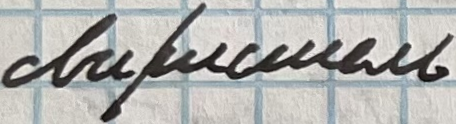свиристель
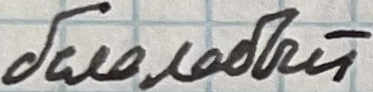белолобый
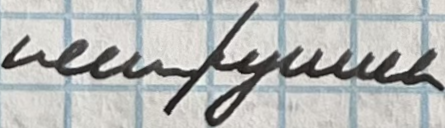пеструшка
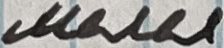малая
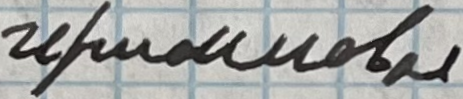черноклювая
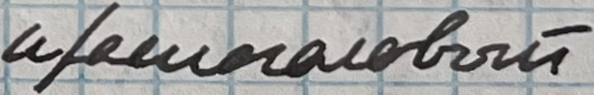красноголовый
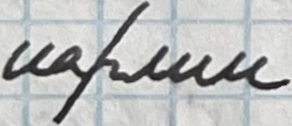карлик
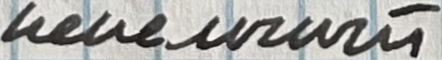пепельный
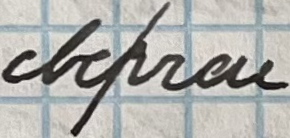сверчок
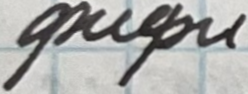фифи
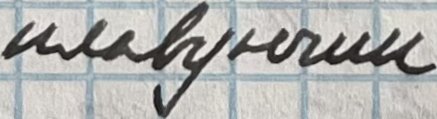плавунчик
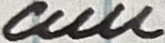сип
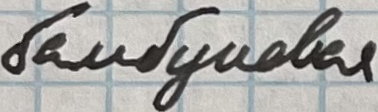бамбуковая
